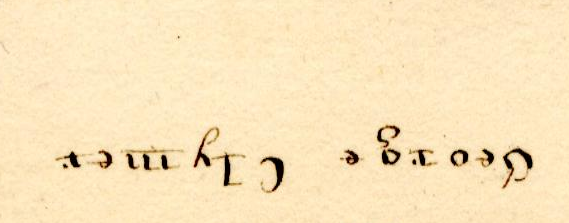George Clymer
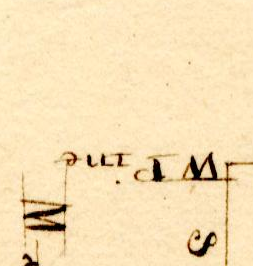W Pine
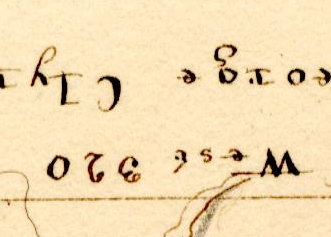West 320
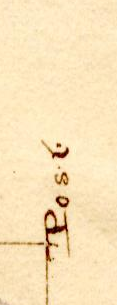Post
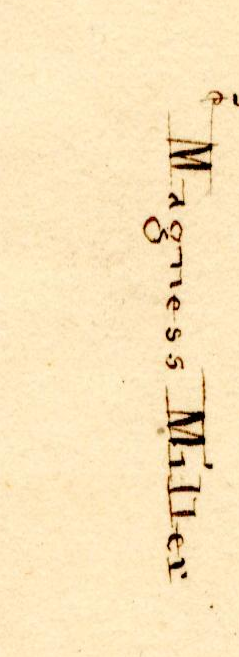Magness Miller
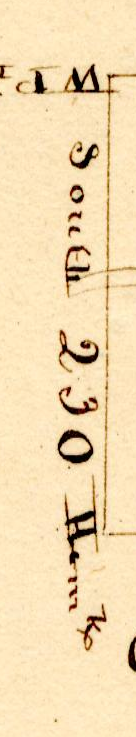South 230 Hem^k
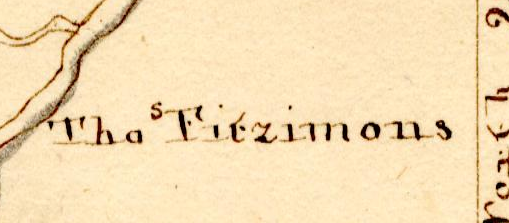Tho^s Fitzimons
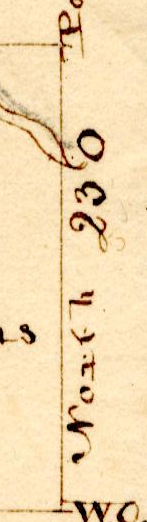North 230
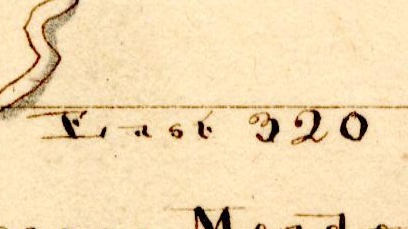East 320
